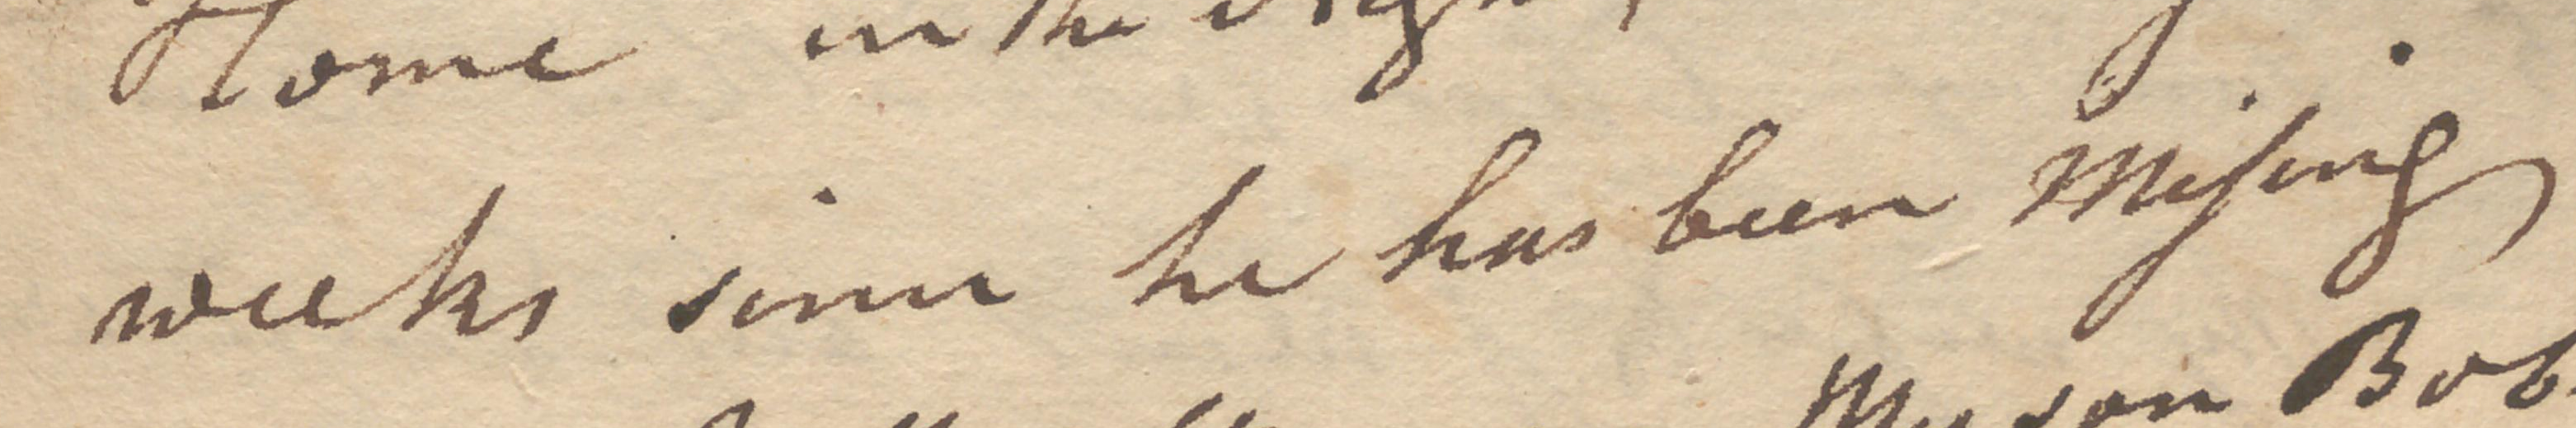weeks since he has been Mising
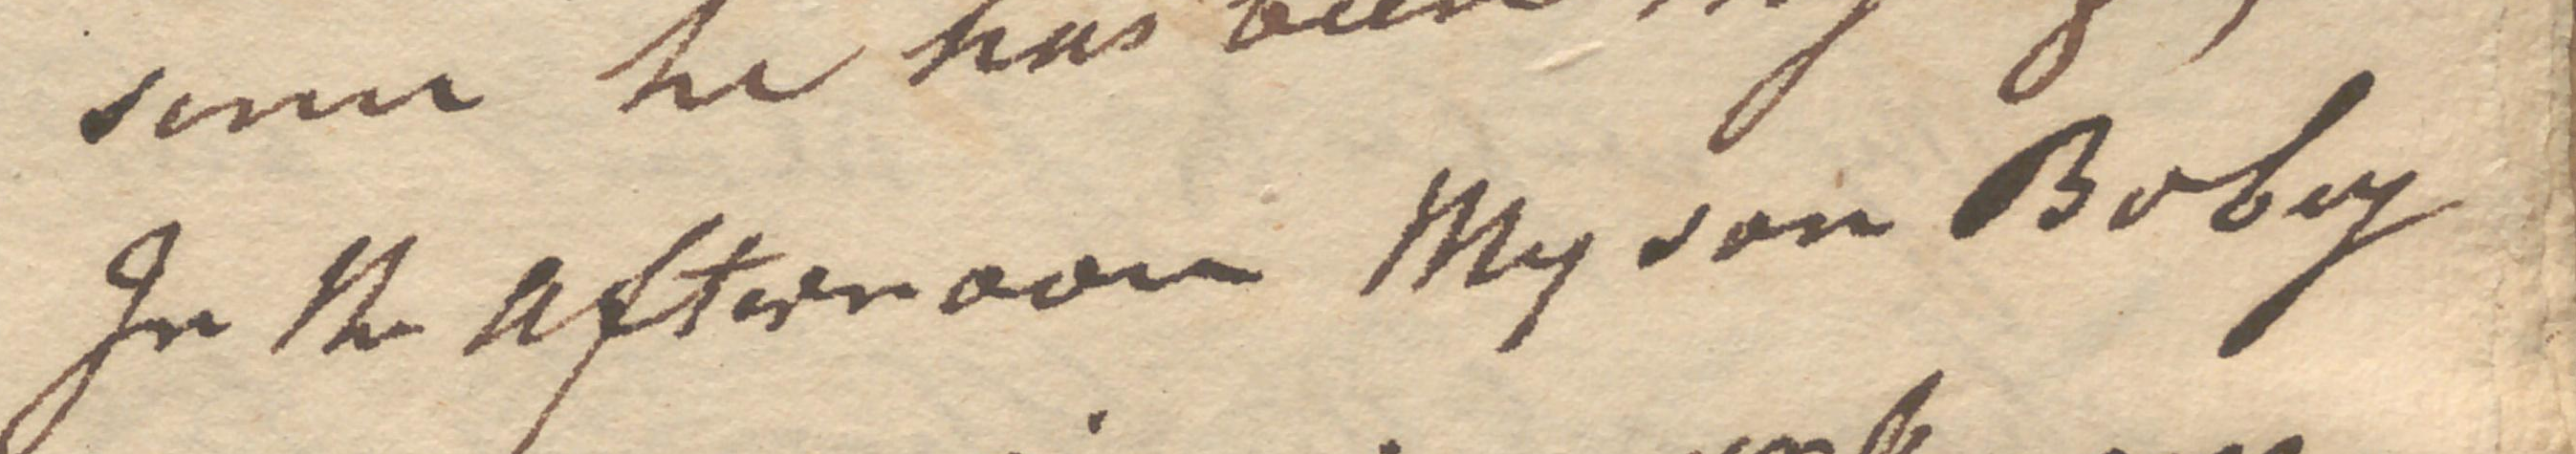In the afternoon My son Bobey
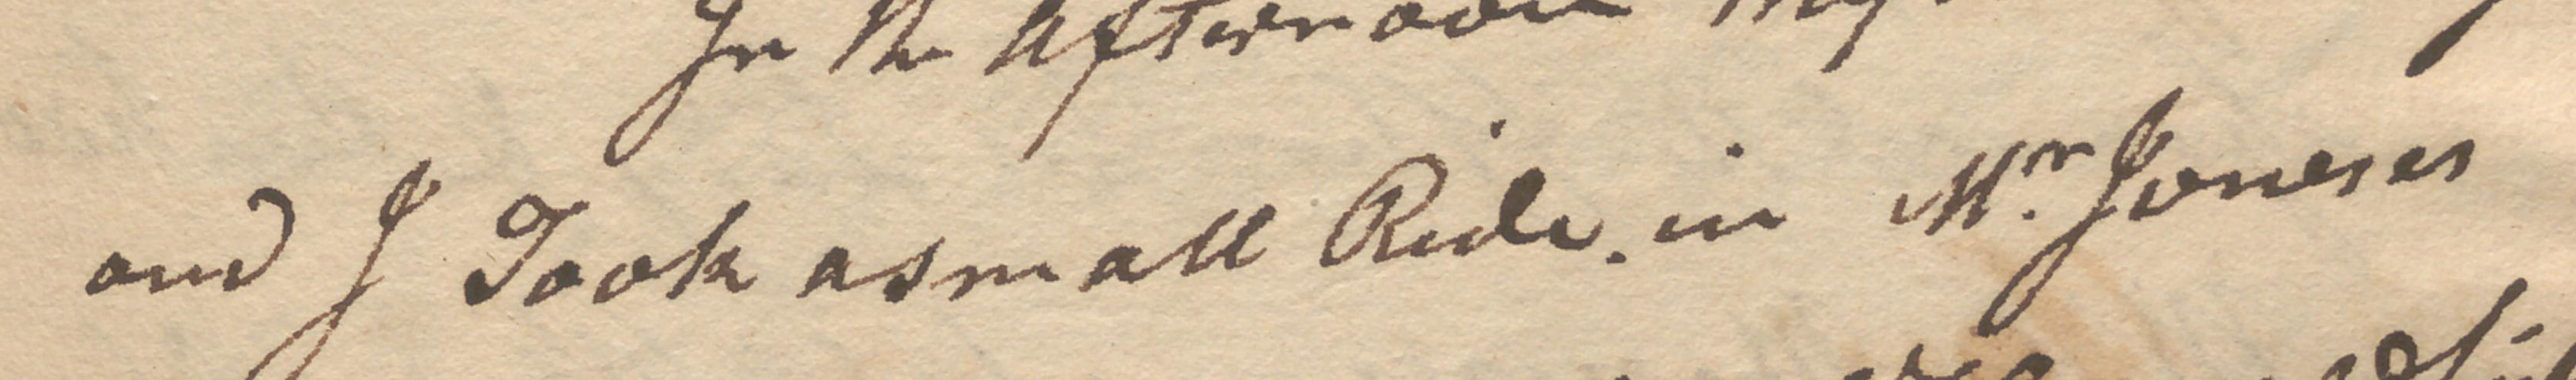and I Took a small Ride in M^r. Joneses
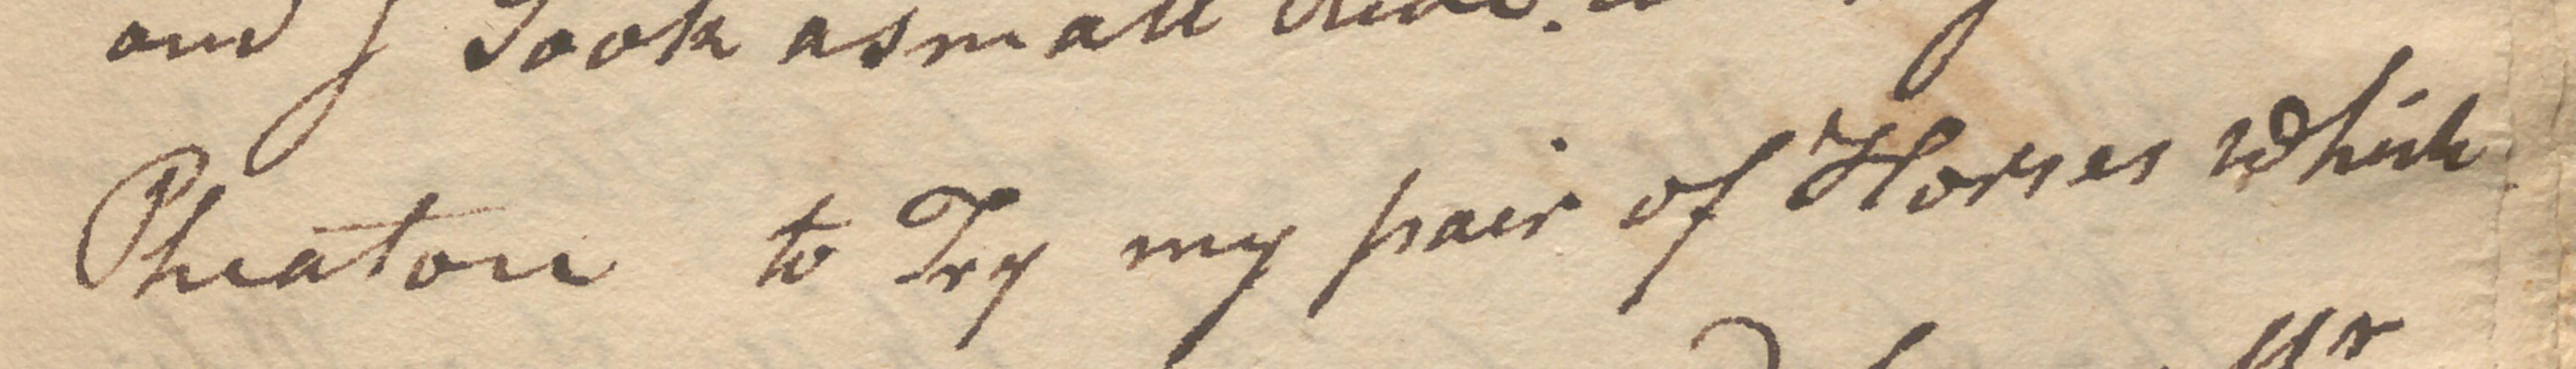Pheaton to Try my pair of Horses which
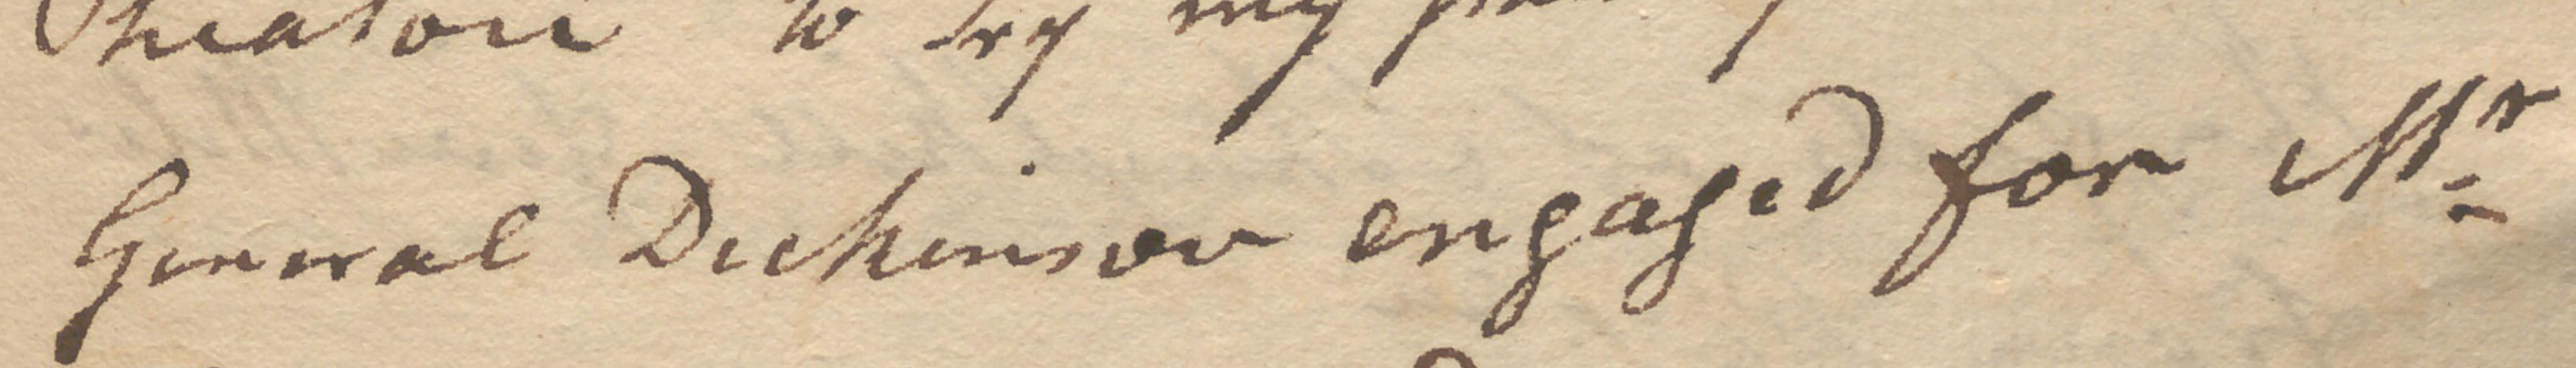General Dickinson engaged for M^r.
